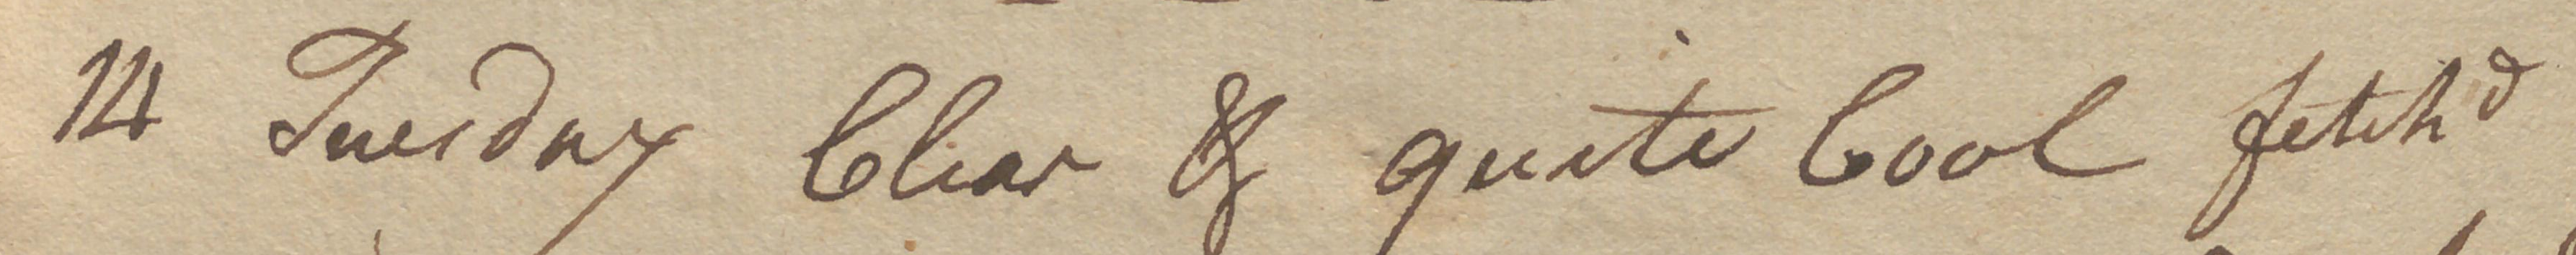1 Tuesday Clear & quite Cool fetch^d
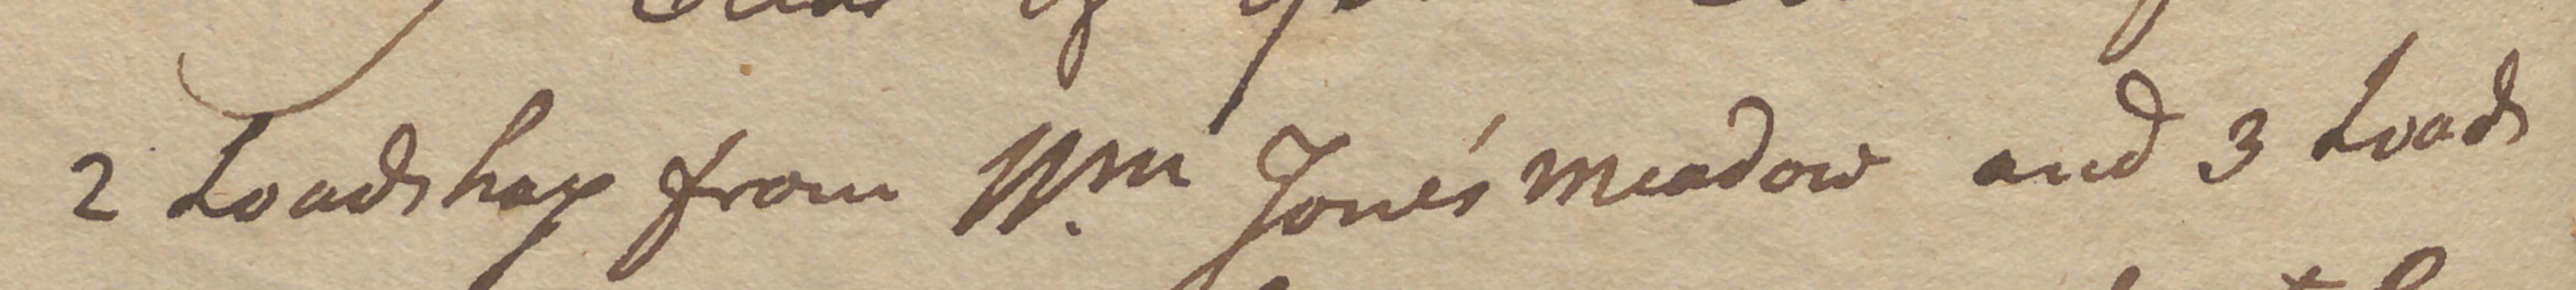2 Loads hay from W^m Jone's Meadow, and 3 Load.
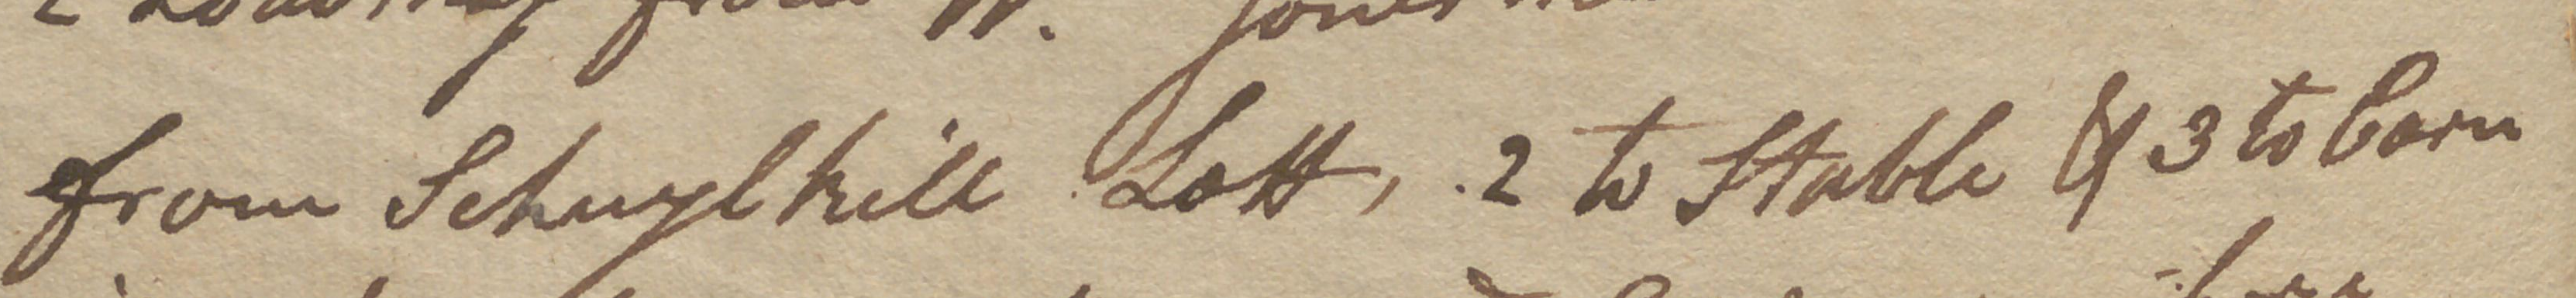from Schuylkill Lott, 2 to Stable & 3 to Corn
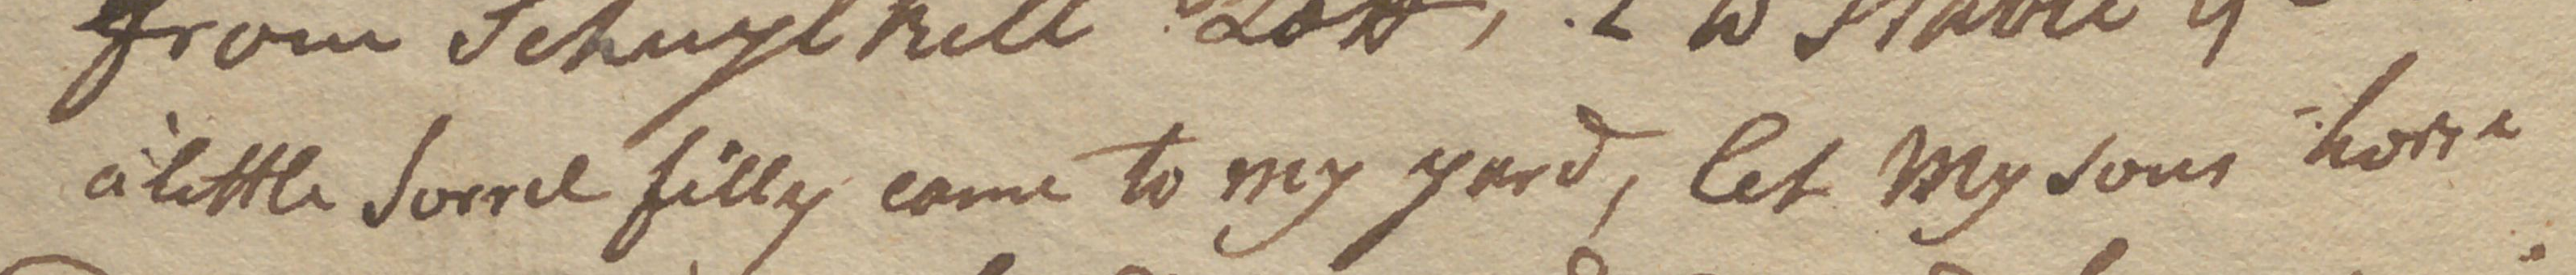a little Sorrel filly came to my yard, let My sons horse
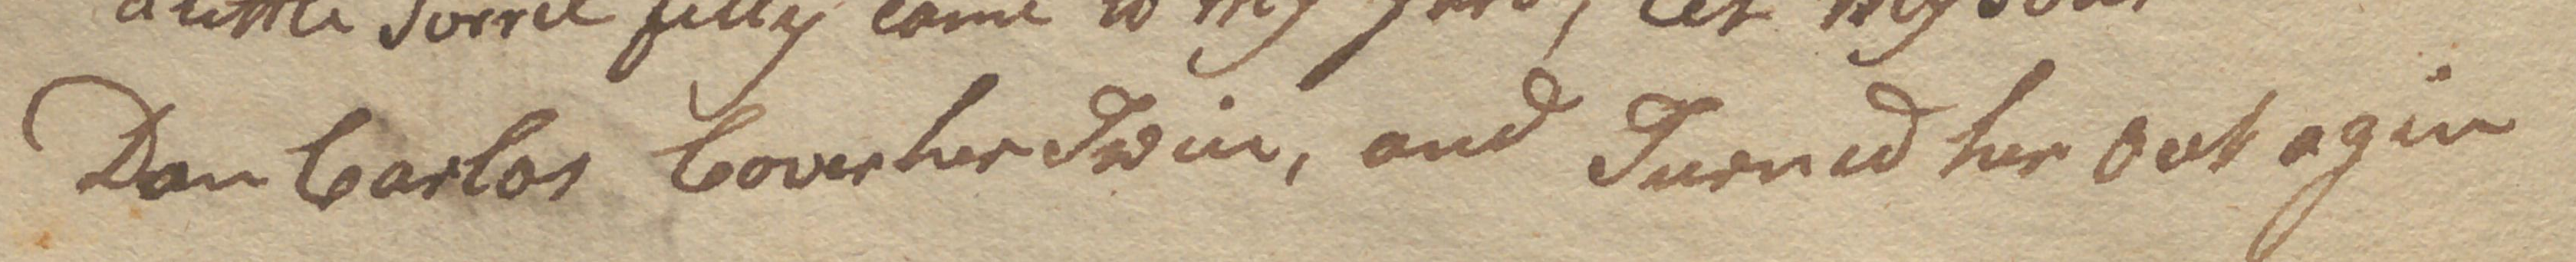Dan Carlos Cover her Twin, and Turned her out agin
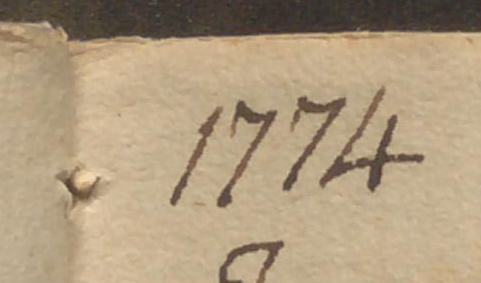1774
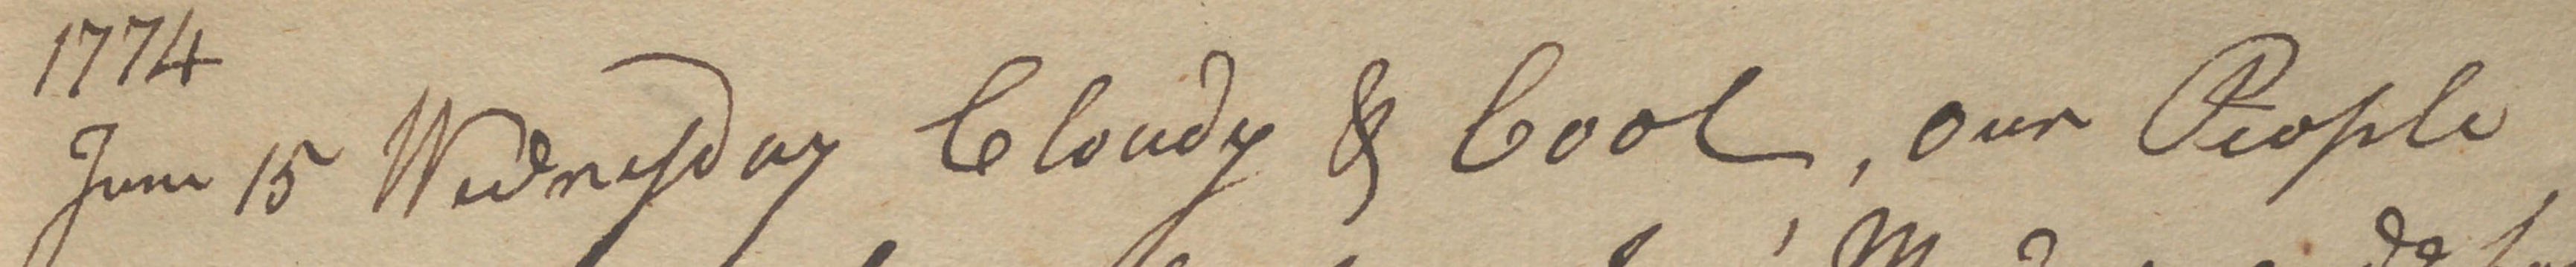June 15 Wednesday Cloudy & Cool, our People
